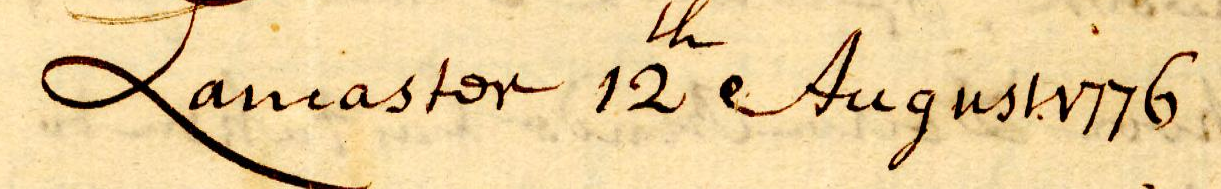Lancaster 12^th Augustr776
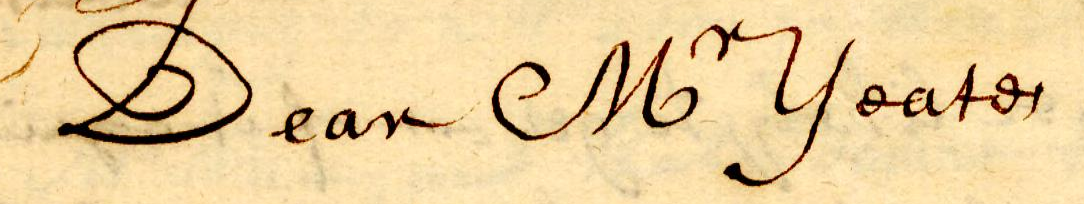Dear M^r. Yeates
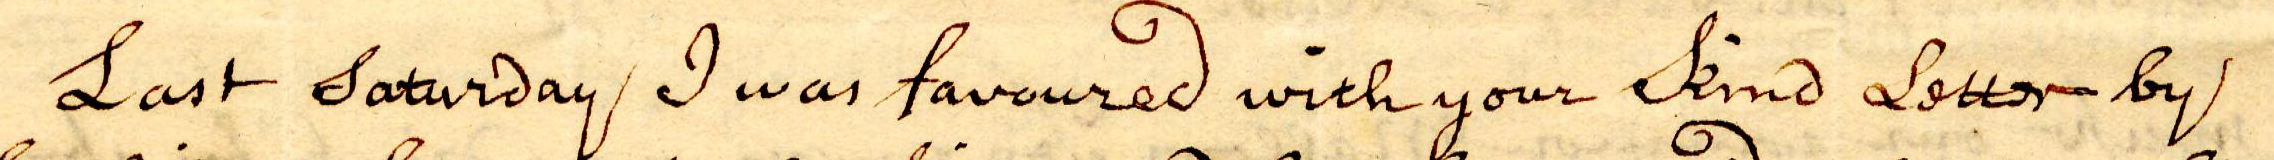Last Saturday I was favoured with your kind Letter- by
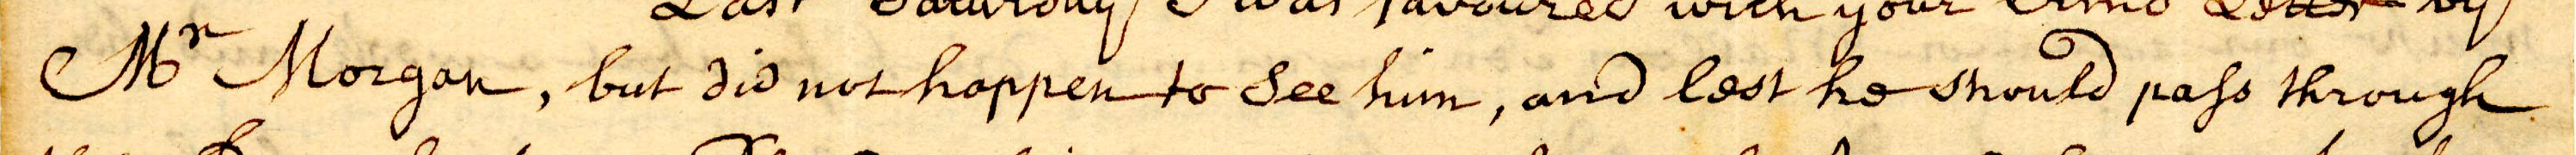M^r Morgan, but did not happen to See him, and lest he should pass through
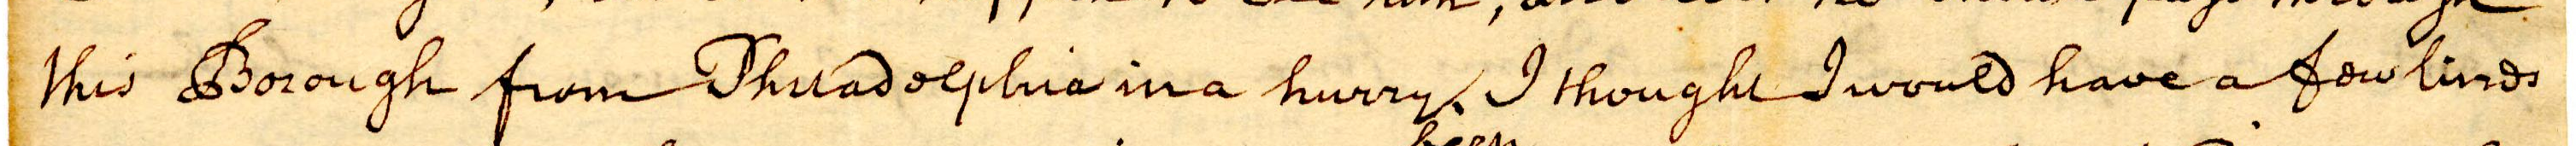this Borough from Philadelphia in a hurry, I thought I would have a few lines
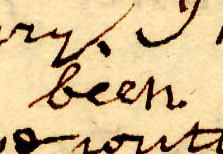been
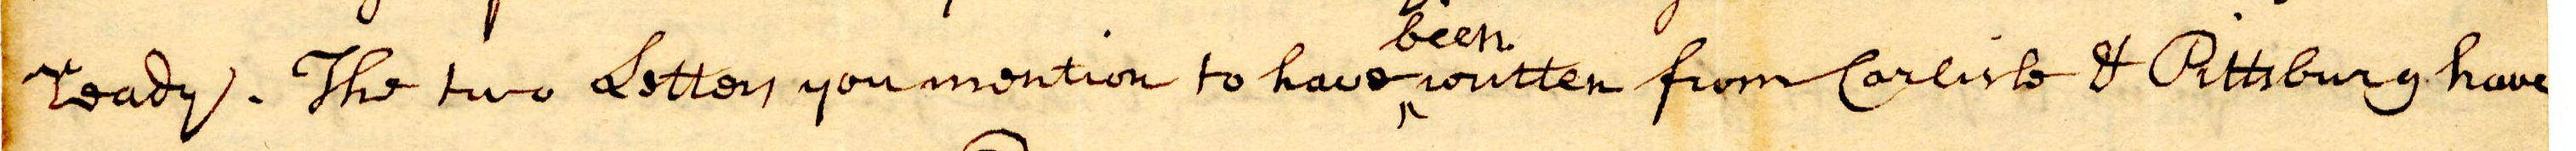ready. The two Letters you mention to have ^ written from Carlisle & Pittsburg have
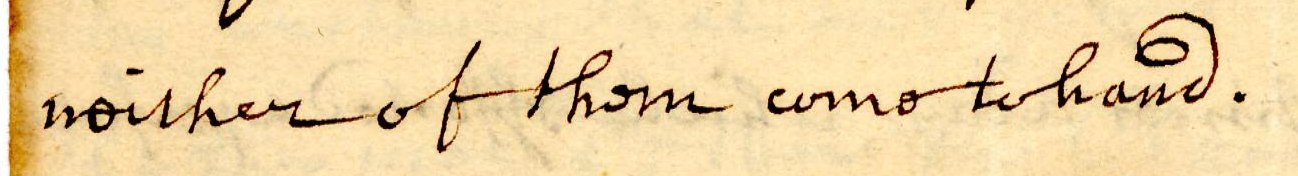neither of them come to hand.
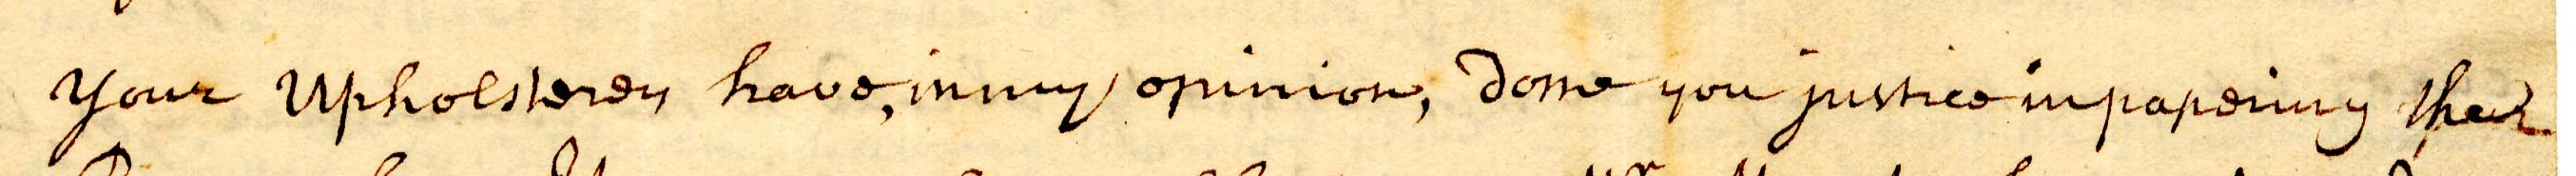your Upholsterers have, in my opinion, done you justice in papering the
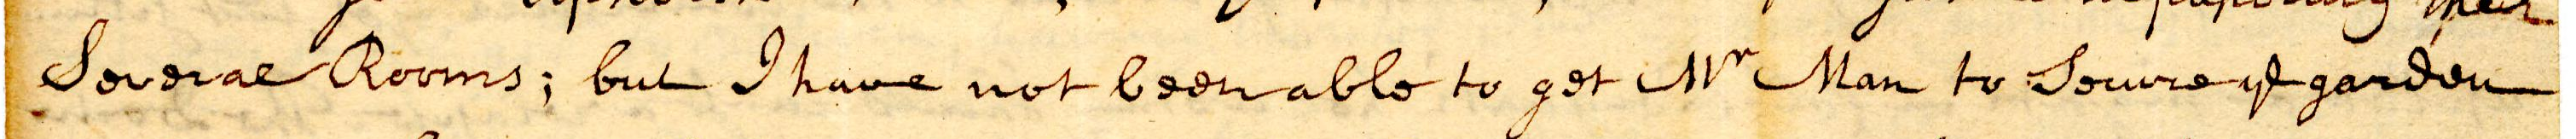Several Rooms; but I have not been able to get M^r Man to Soure y^e garden
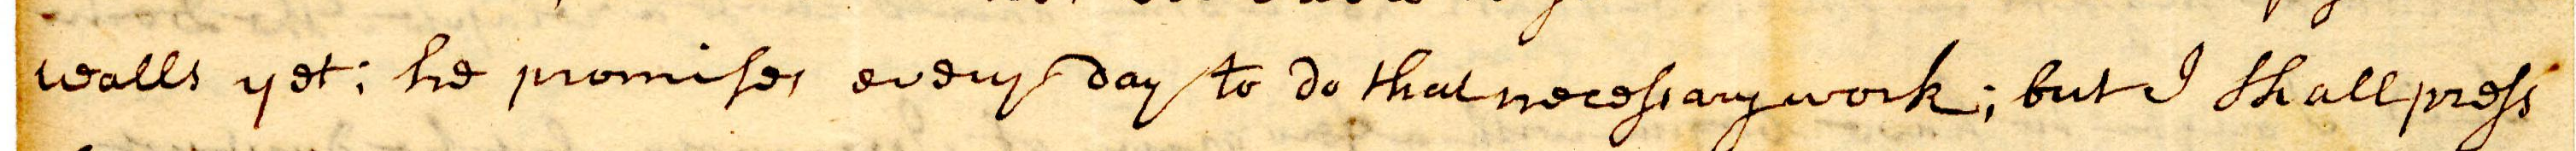walls yet: he promises every day to do that necessary work; but I shall press
